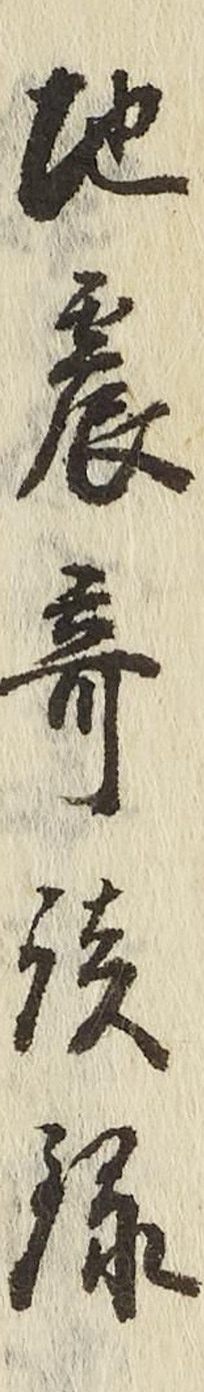地震奇談録
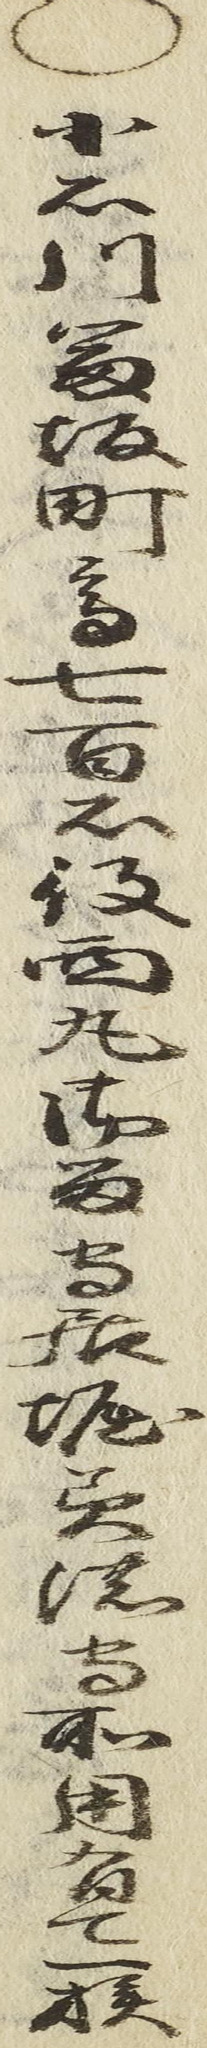○小石川富坂町高七百石役西丸御留守居堀美濃守所用有て一族
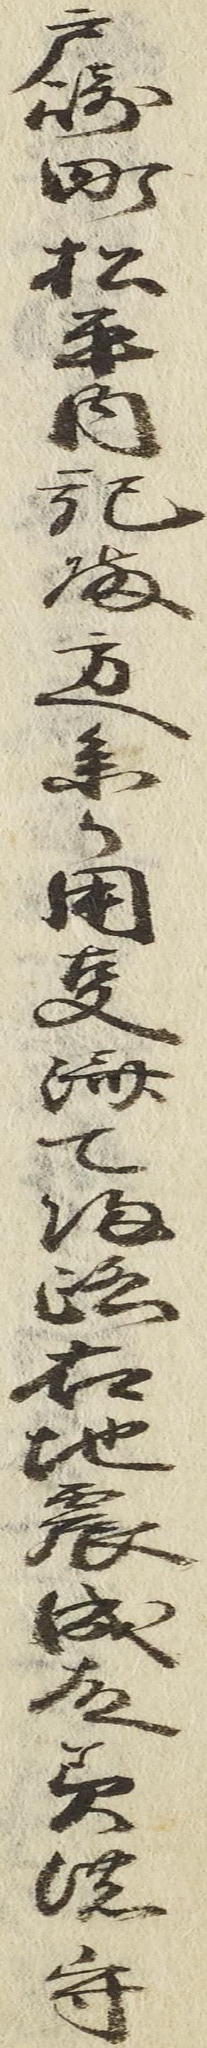戸崎町松平内記殿方へ参り用事済て帰路右地震成故美濃守
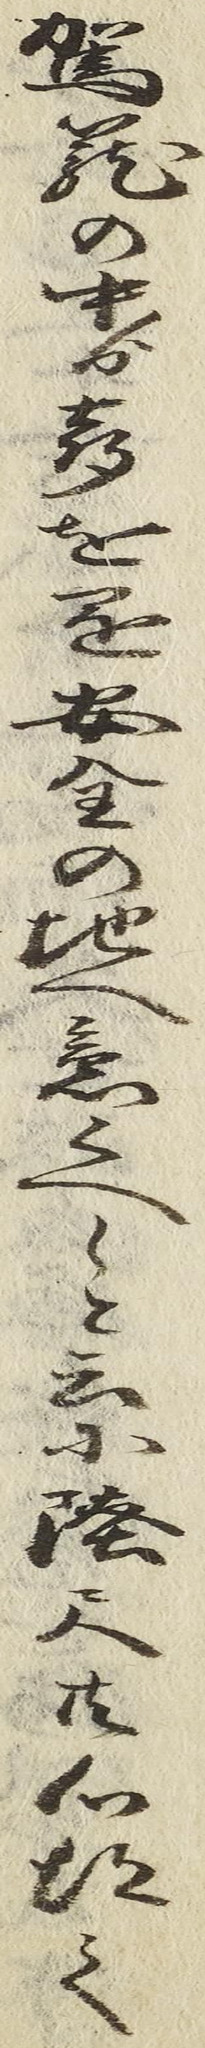駕籠の中ゟ声を懸安全の地へ急くへしと云に陸尺共心得て
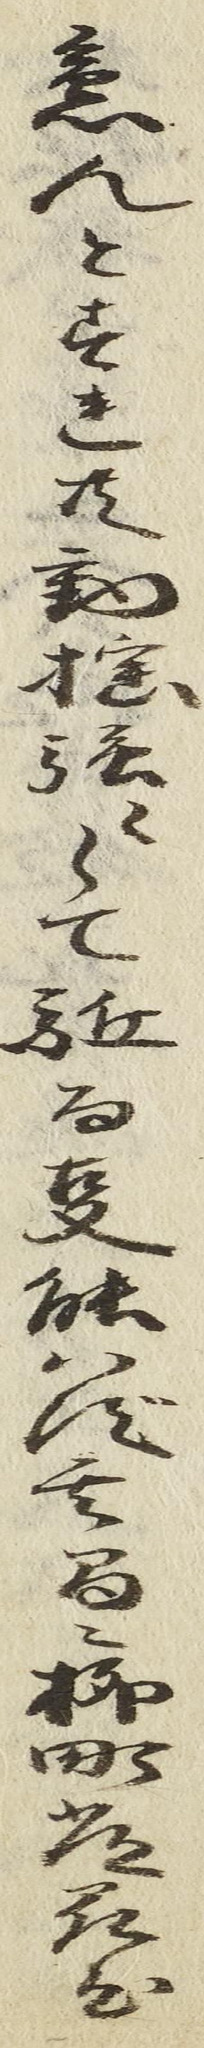急んとすれ共動揺強くして駈る事能はず其間ニ柳町常州屋
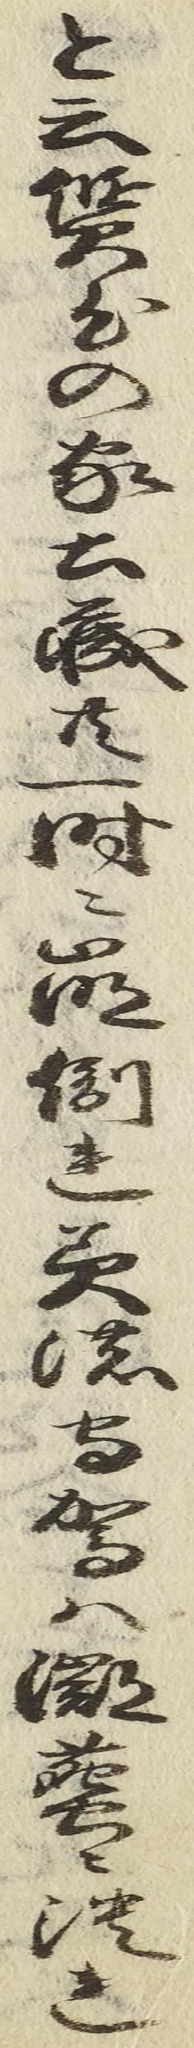と云質屋の家土蔵共一時ニ崩倒れ美濃守駕は微塵ニ潰れ
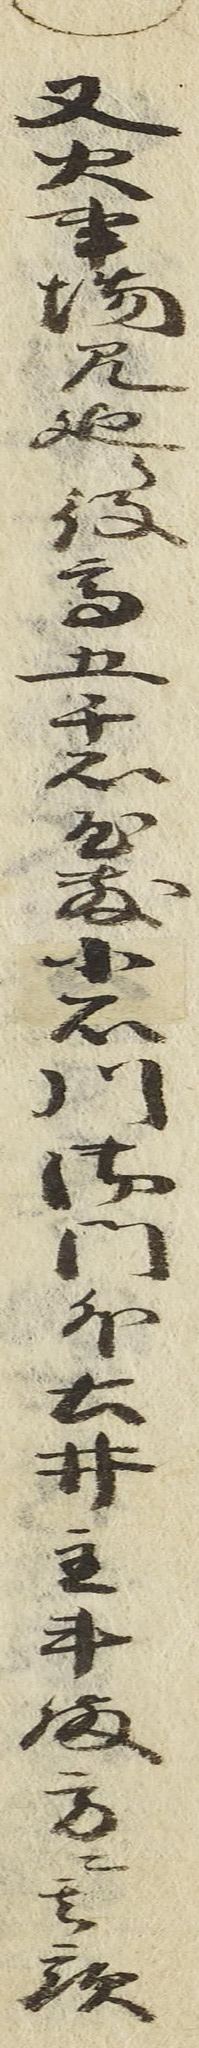○又火事場見廻り役高五千石屋敷小石川御門外土井主計殿方ニ其夜
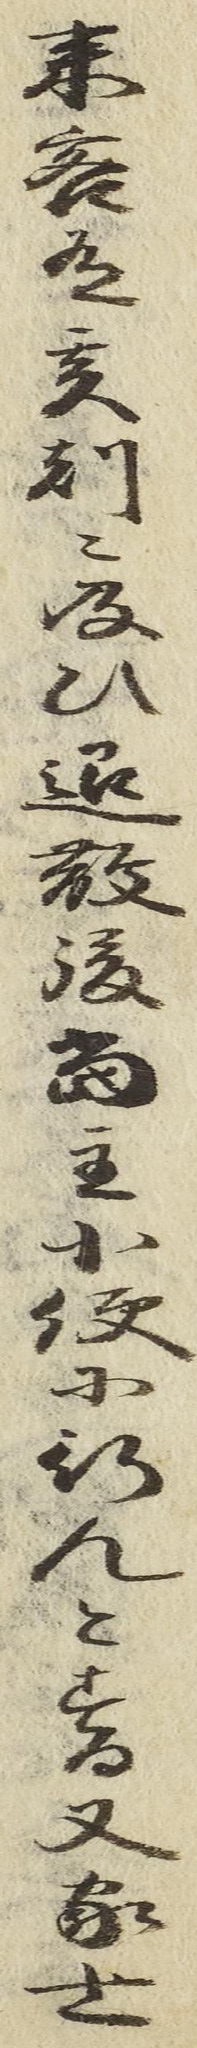来客有亥刻ニ及ひ退散後当主小便に行んとする又家士
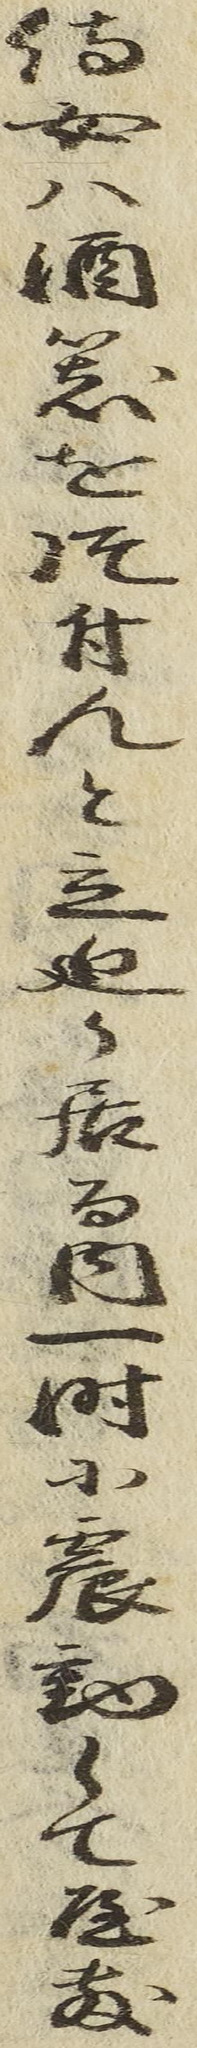侍女は酒器を片付んと立廻り居る内一時に震動して屋敷

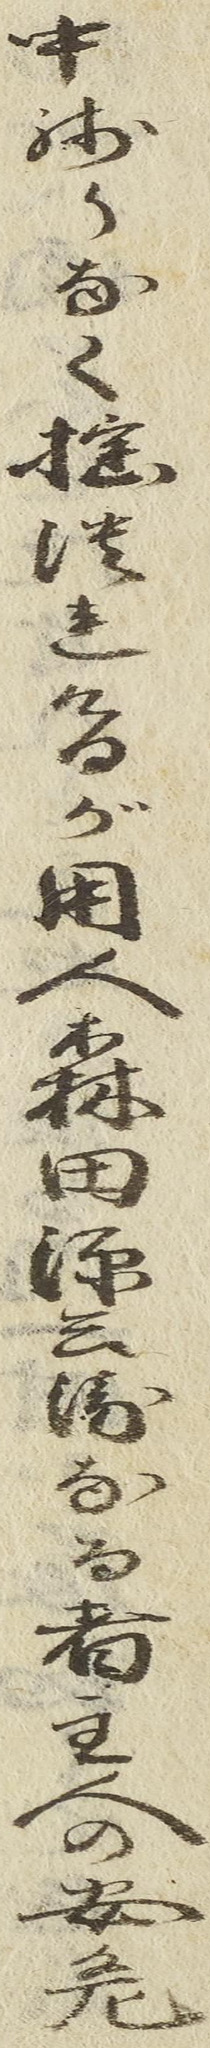中残りなく揺潰れけるが用人森田源兵衛なる者主人の安危
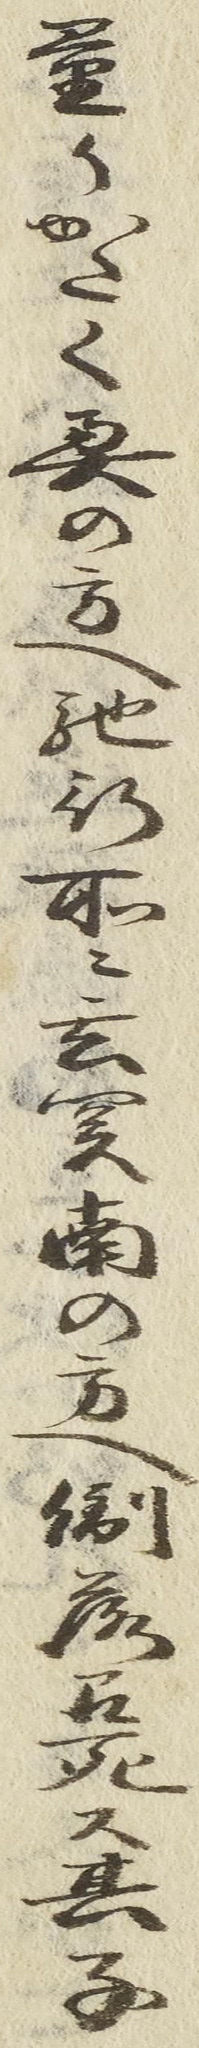量りかたく奥の方へ馳行所々玄関南の方へ倒落即死ス其子
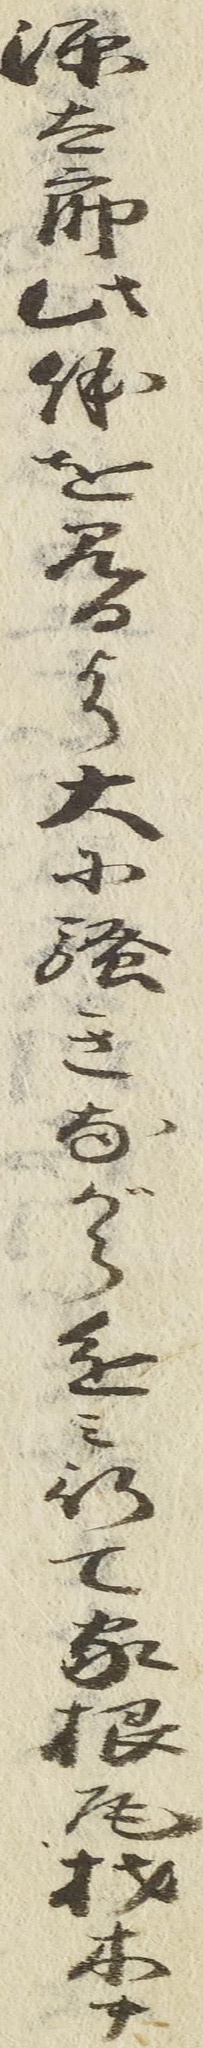源太郎此体を見るより大に騒きながら進み行て家根瓦材木ヲ
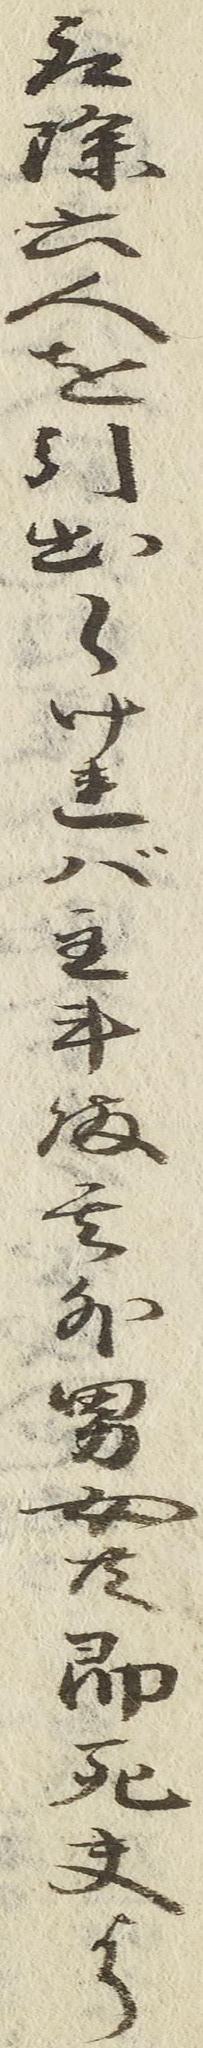取除六人を引出しければ主計殿其外男女共即死夫より
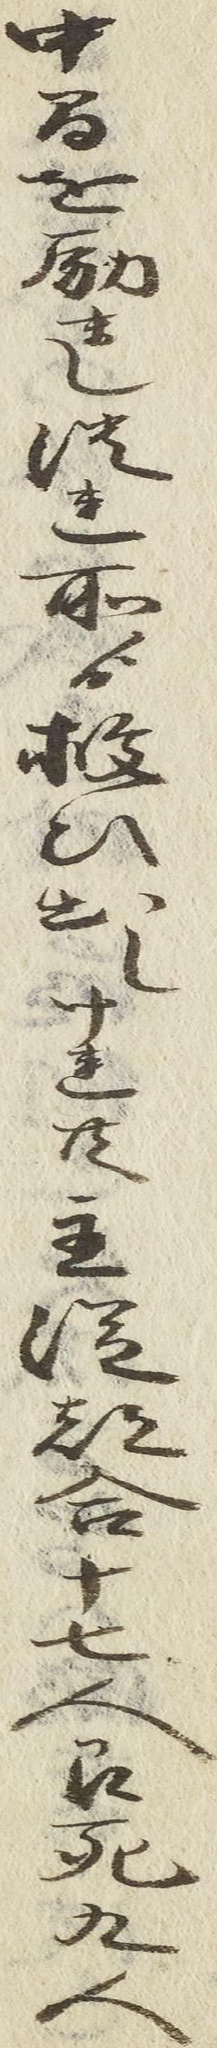中間を励まし潰れ所ゟ救ひ出しけれ共主従都合十七人即死九人
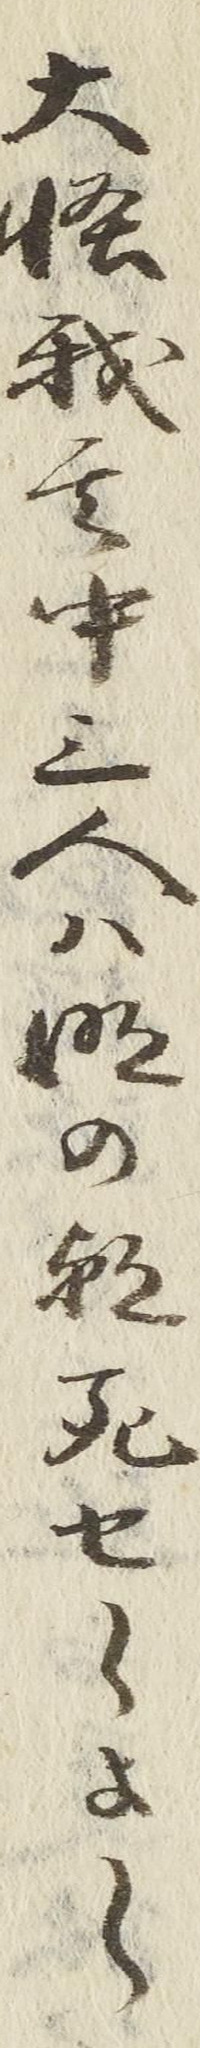大怪我其三人は明の朝死せしよし
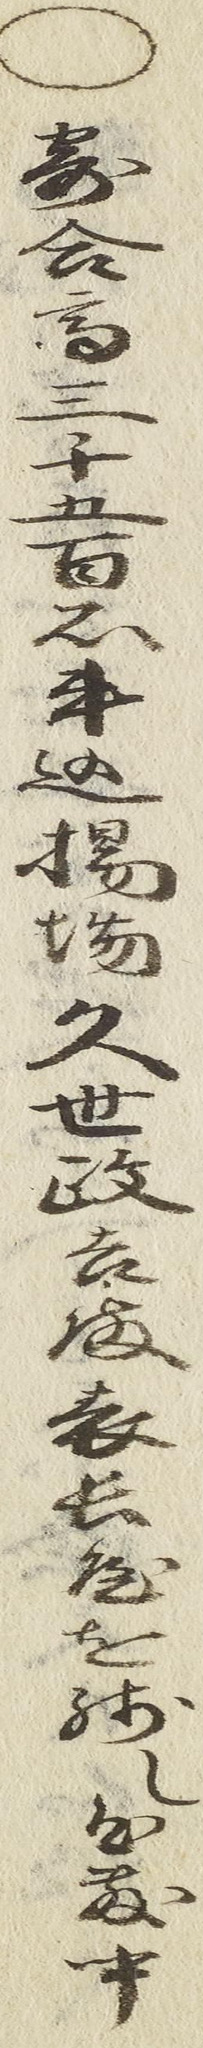○寄合高三千五百石牛込揚場久世政吉殿表長屋を残し屋敷中
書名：安政二年震災記事　完
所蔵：東京大学地震研究所図書室 Earthquake Research Institute Library, The University of Tokyo, JAPAN
